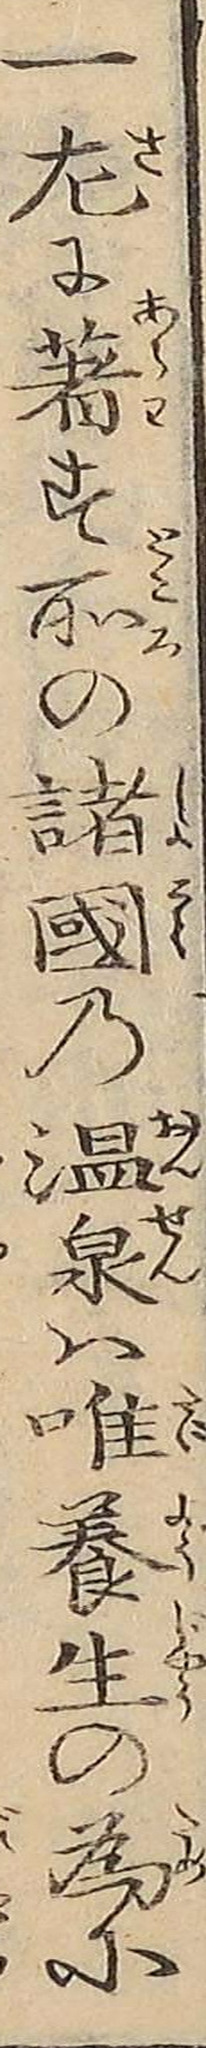一左に著す所の諸国の温泉は唯養生の為に
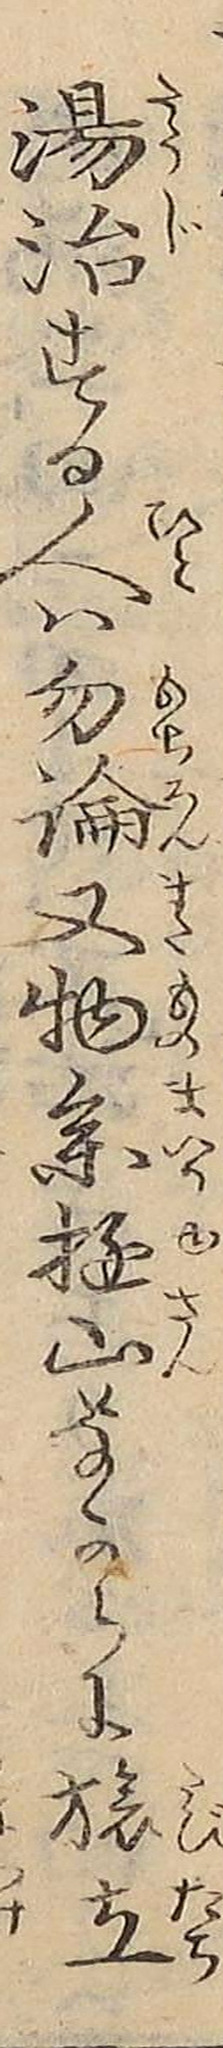湯治する人は勿論又物参遊山なからに旅立
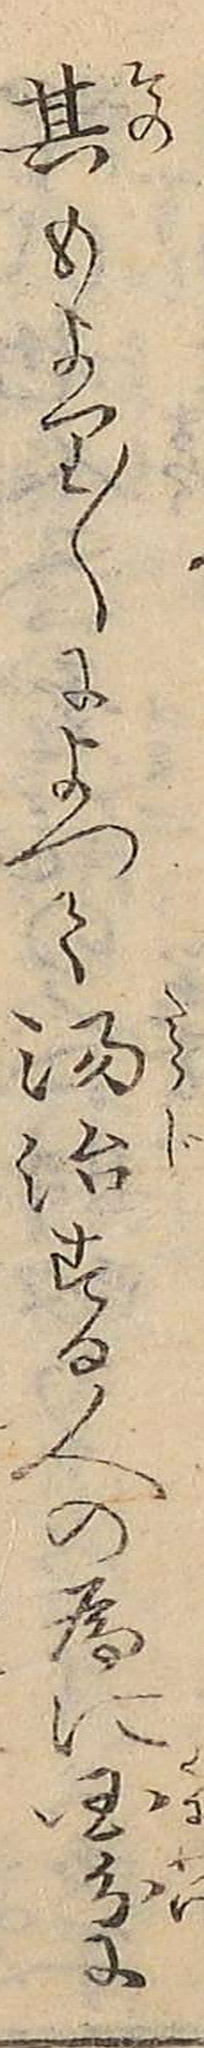其もより〳〵によつて湯治する人の為に国分に
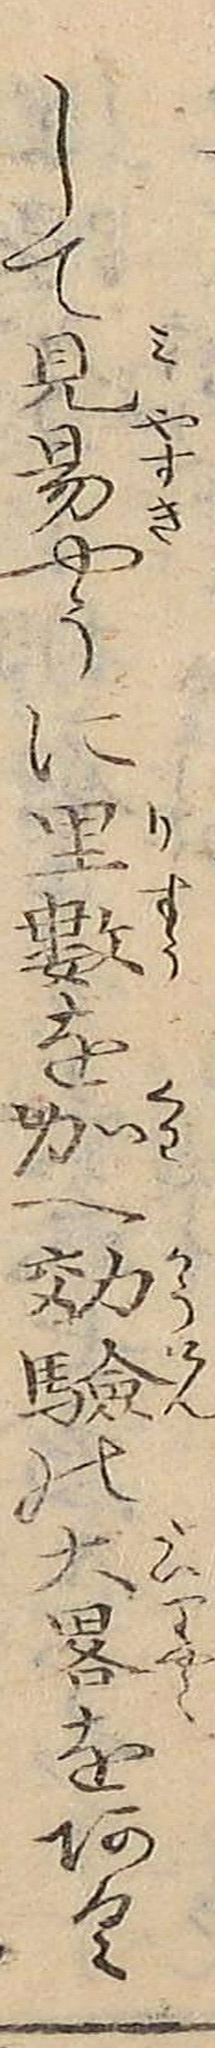して見易やうに里数を加へ効験の大略をあく
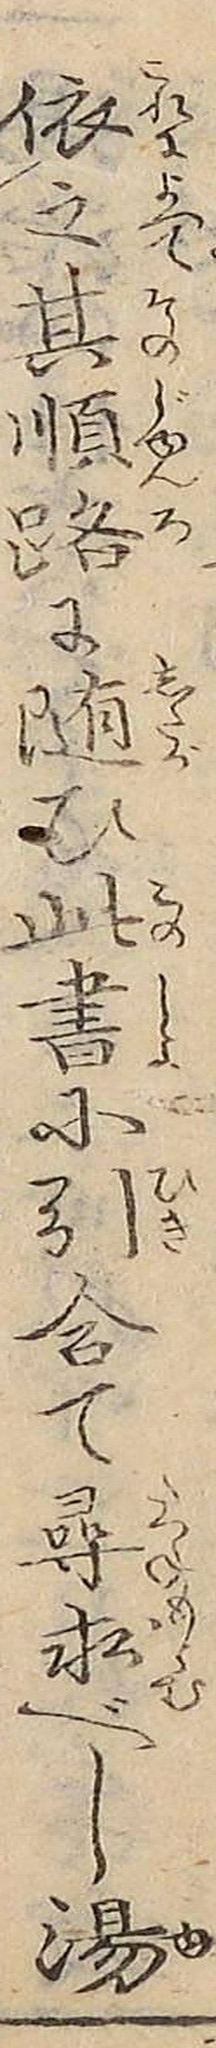依之其順路に随ひ此書に引合て尋求べし湯
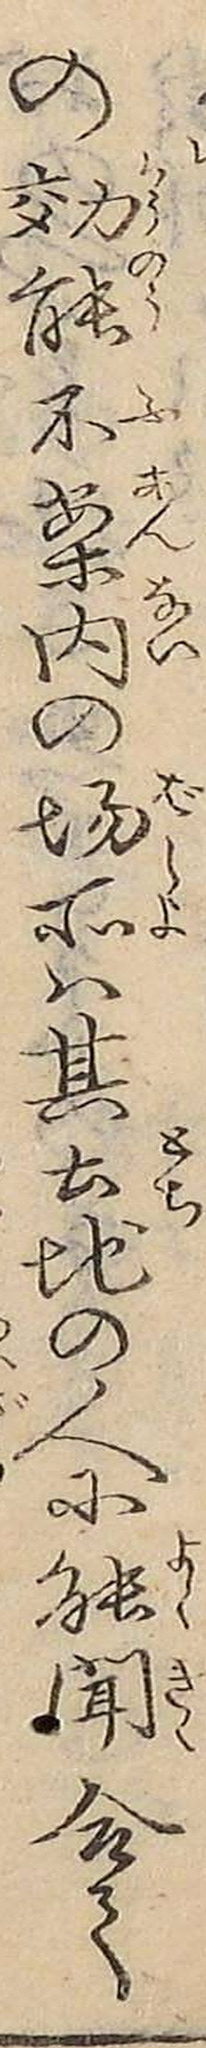の効能不案内の場所は其土地の人に能聞合て
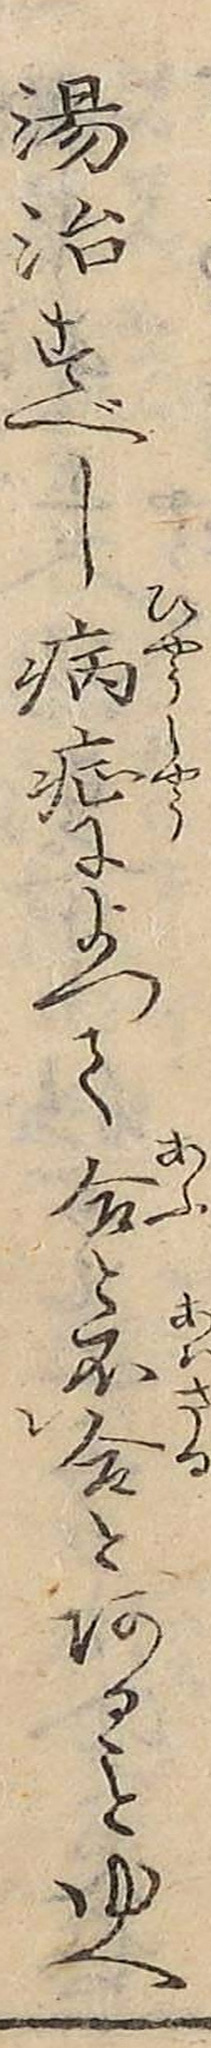湯治すべし病症によつて合と不合とあることゆへ
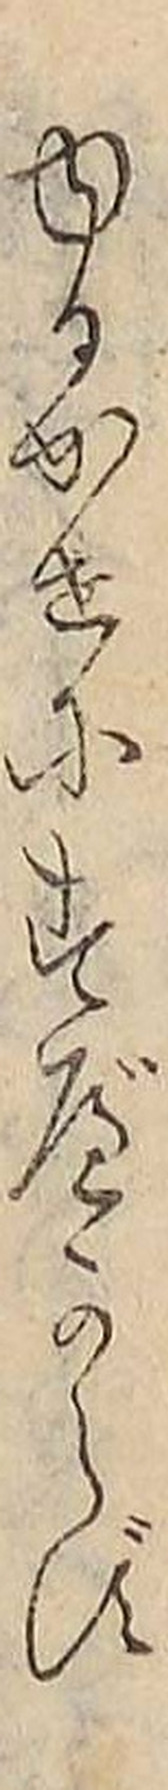ゆるかせにすべからず
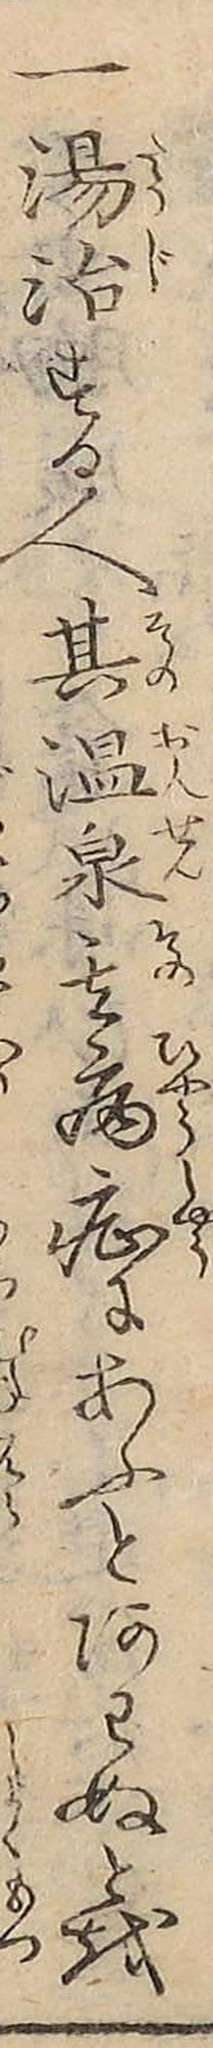一湯治する人其温泉其病症にあふとあわぬとを
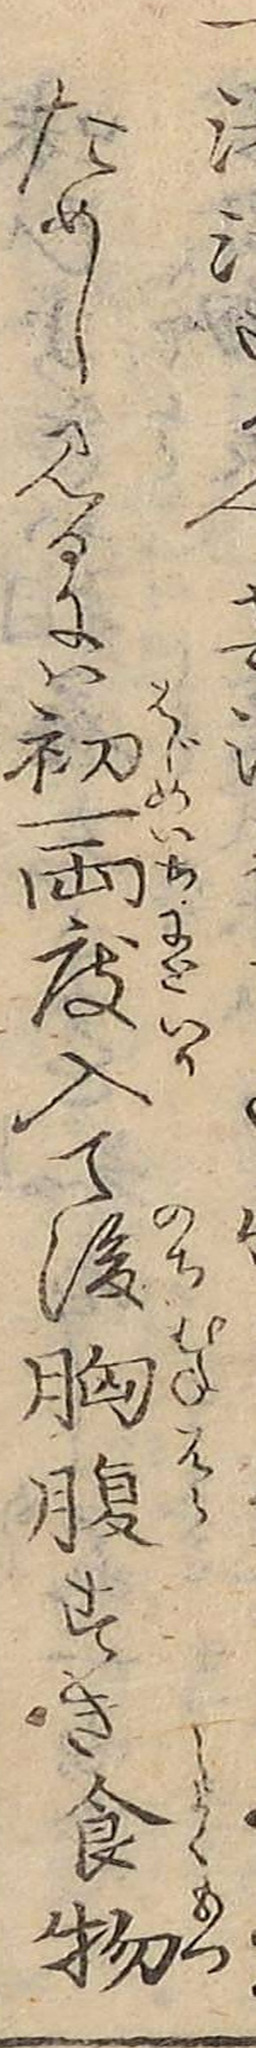ためしみるには初一両度入て後胸腹すき食物

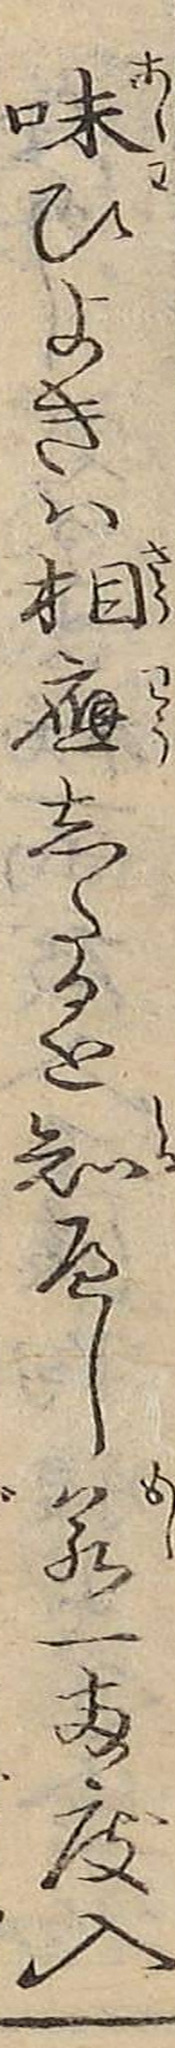味ひよきは相応したると知へし若一両度入
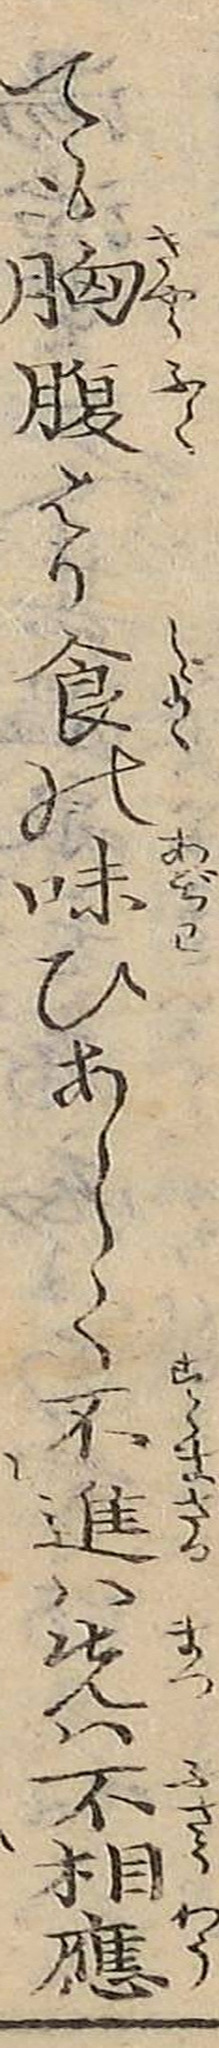ても胸腹はり食の味ひあしく不進は先は不相応
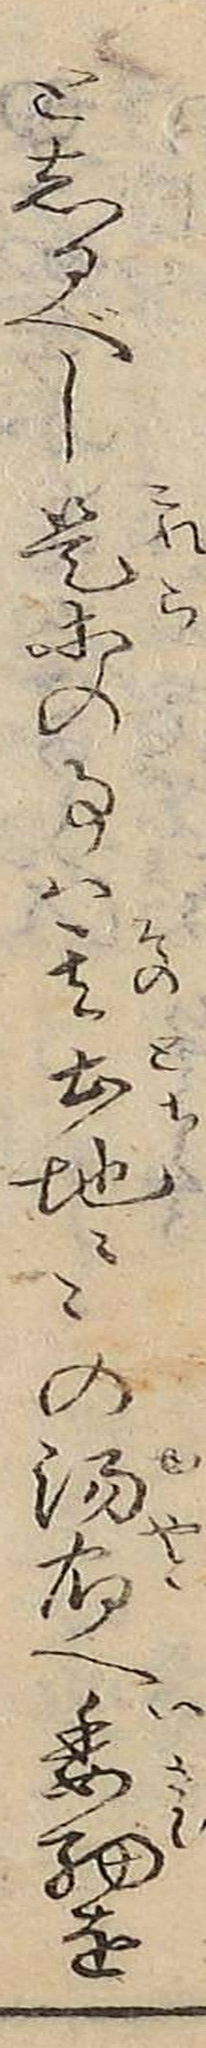としるべし是等の事は其土地々々の湯宿へ委細を
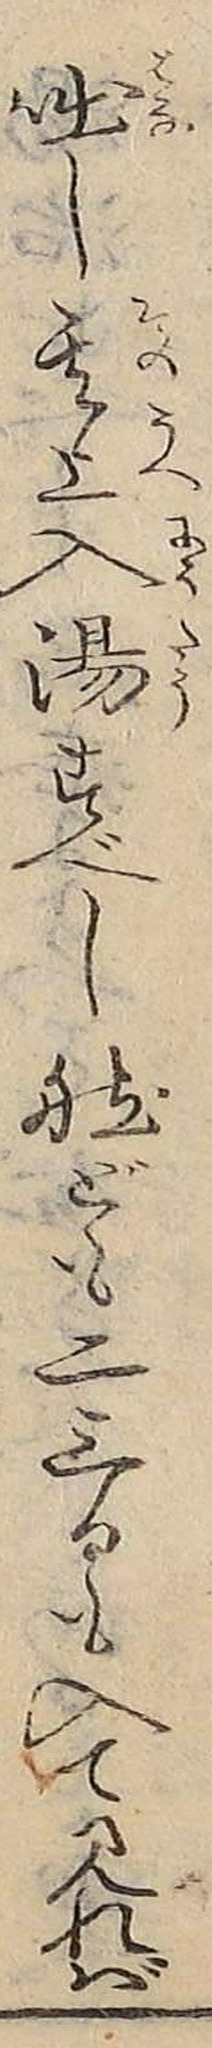咄し其上入湯すべし然ども二三日も入て見れば
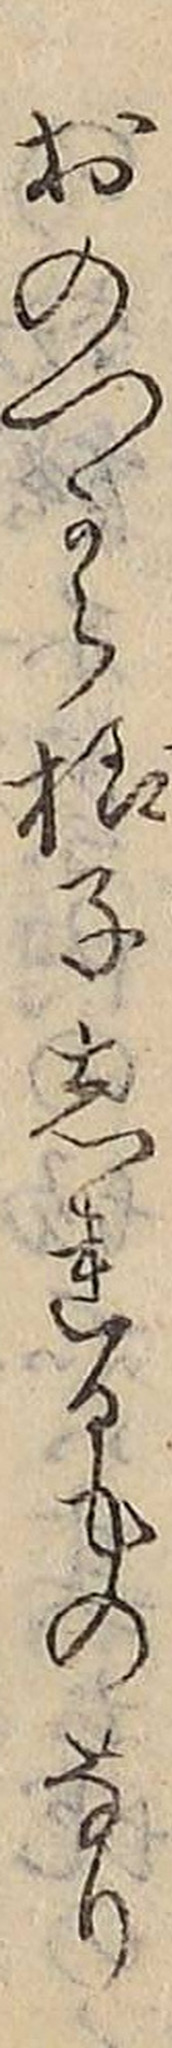おのつから様子しれるものなり
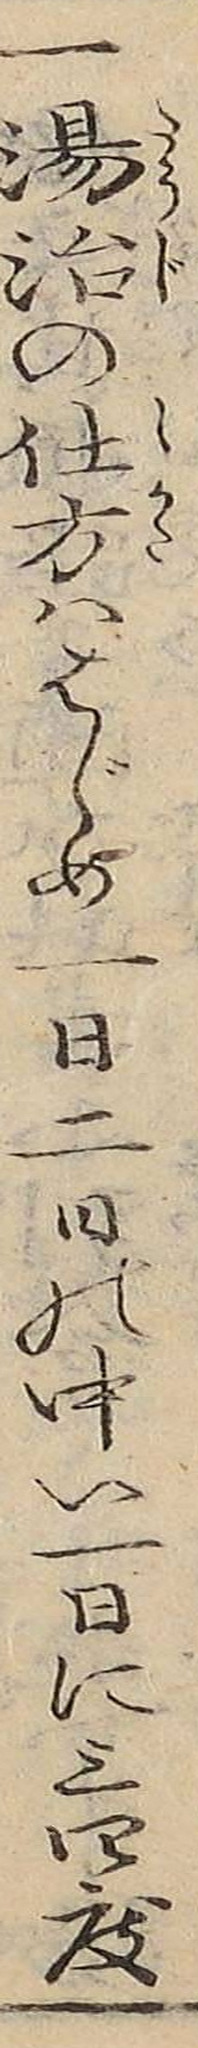一湯治の仕方ははじめ一日二日の中は一日に三四度
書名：旅行用心集
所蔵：神戸大学附属図書館 国文学研究資料館
